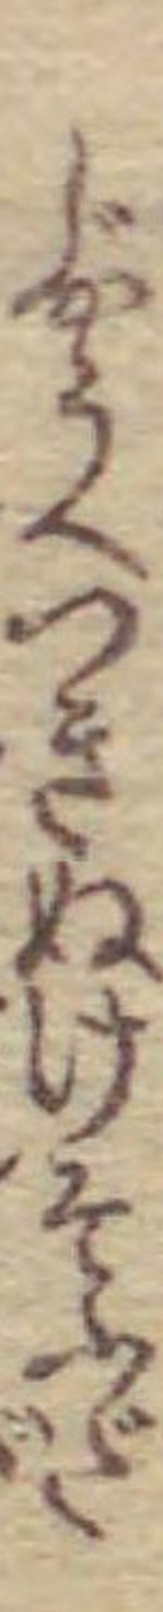じやうへつきぬけそふだ
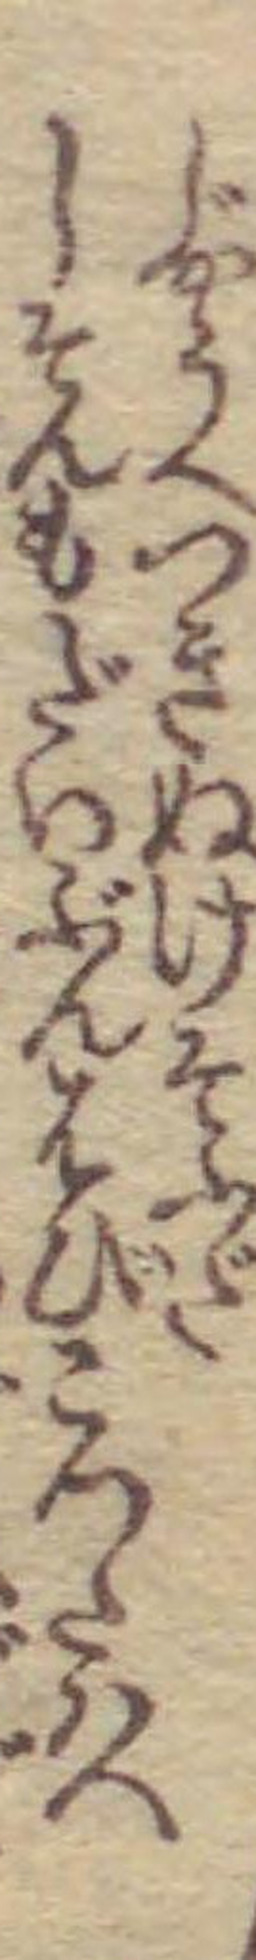しそんもだいぶんはびこつたはへ
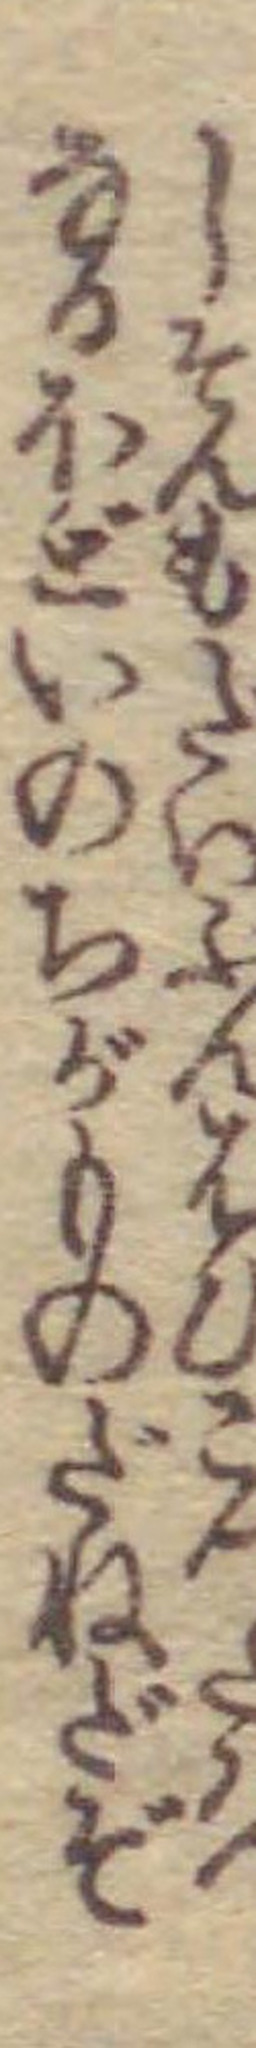なるほどいのちがものだねだぞ

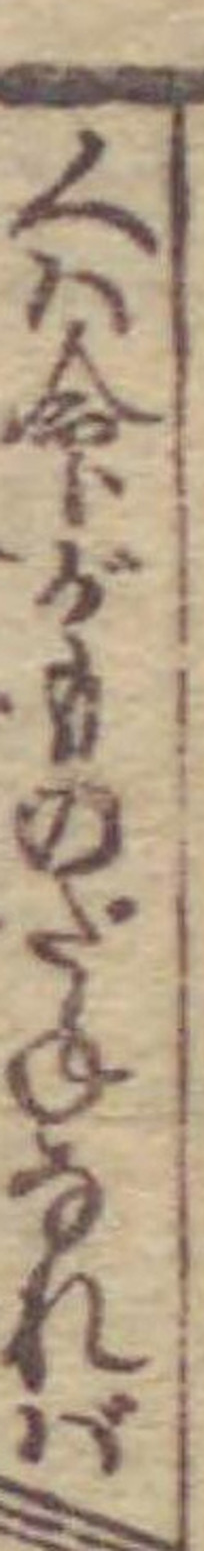くは命がものだねなれば
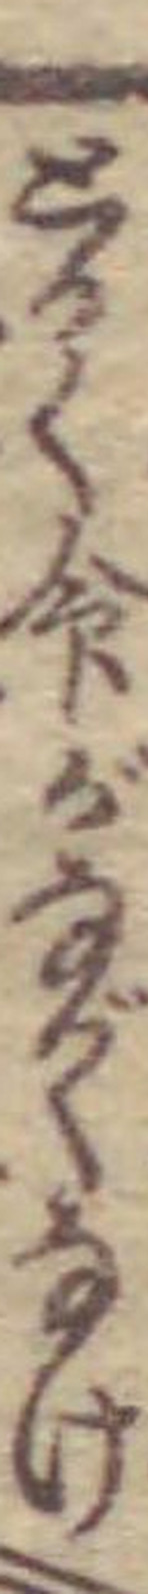とかく命がながくなけ
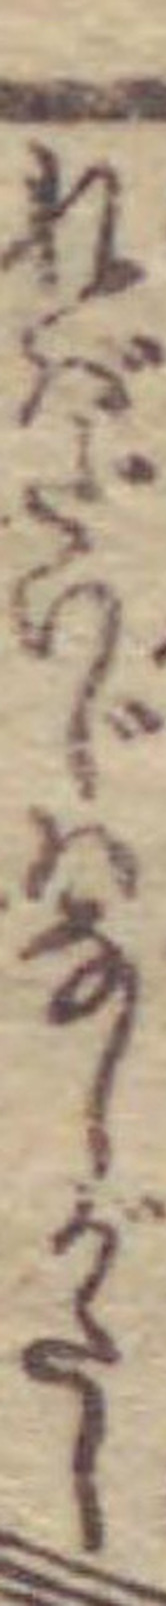ればだいじはなしがたし
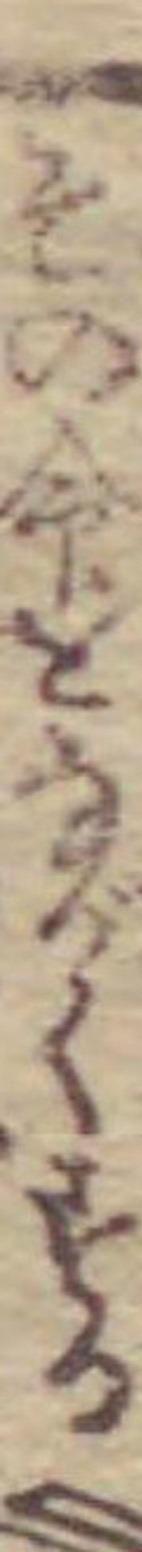その命をながくする
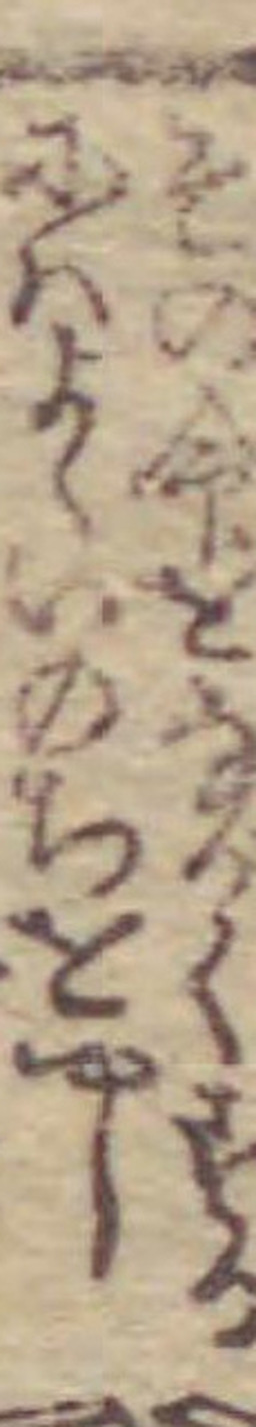にはよくいのちをやし
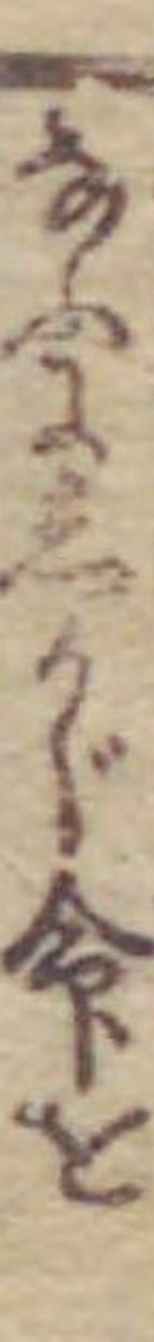なふにしかじ命を
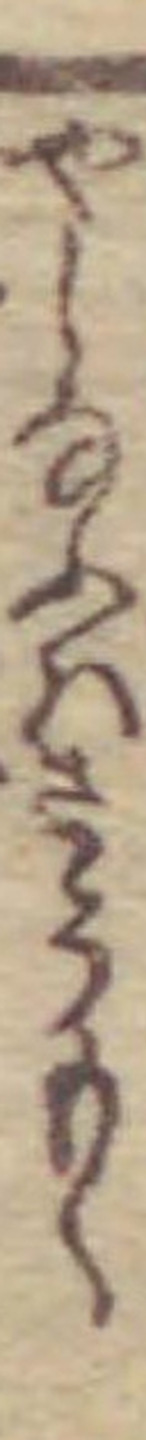やしなふはさうもく
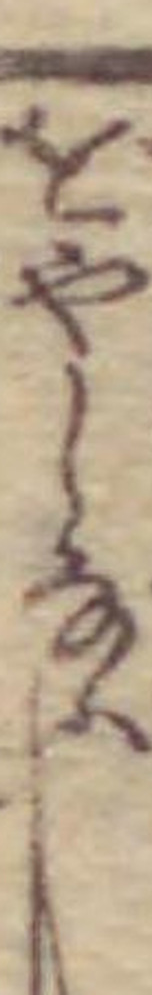をやしなふ
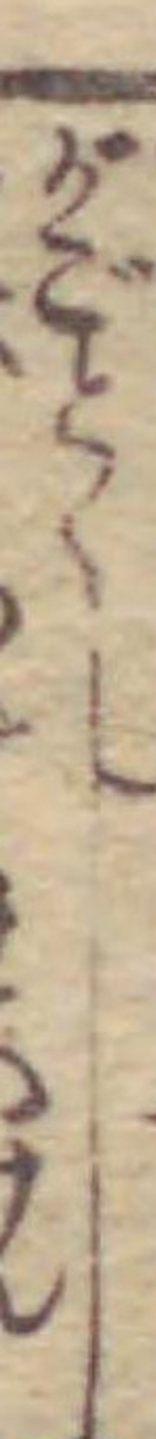がごとく
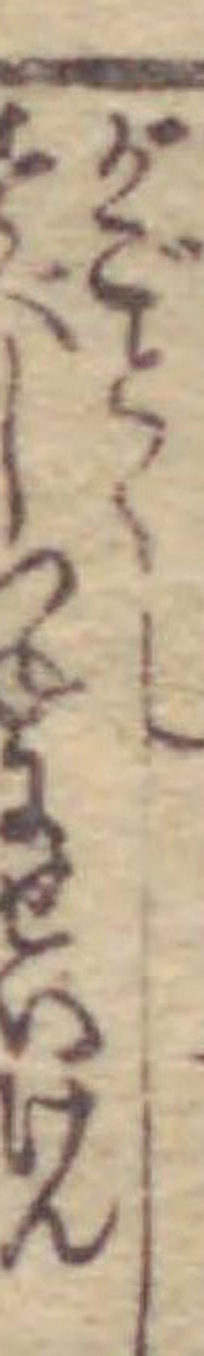すべしつねにせいけん
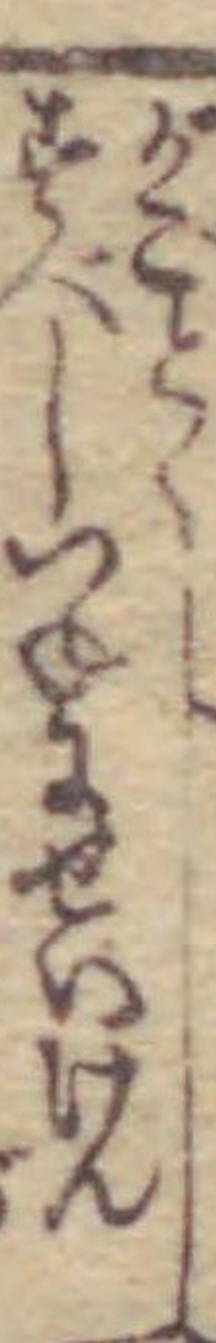すべしつねにせいけん
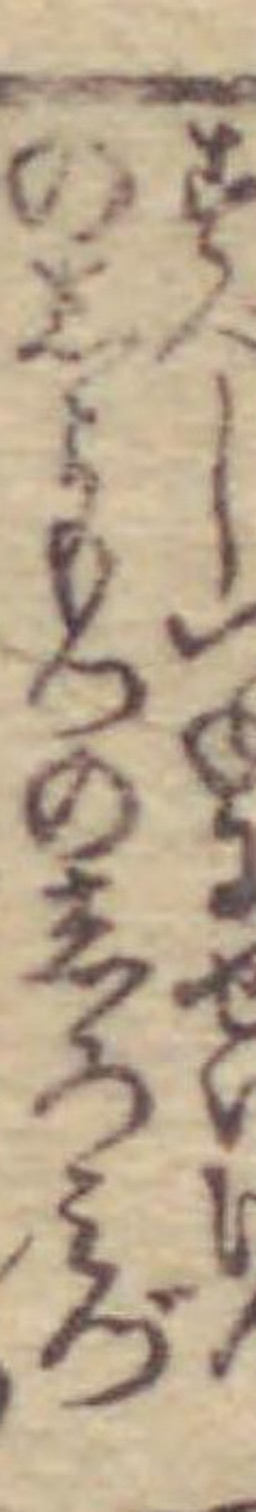のしよもつのしろみづ
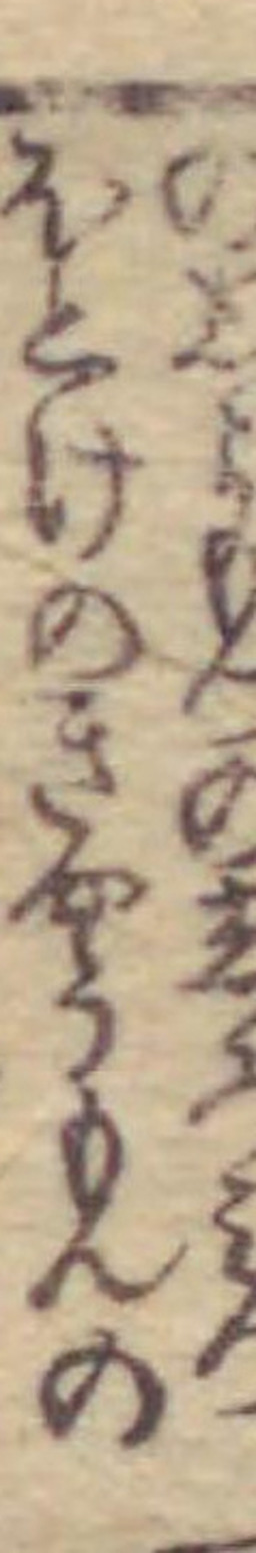ほとけのきやうもんの
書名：御誂染長寿小紋 : 3巻
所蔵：国立国会図書館 National Diet Library, JAPAN
